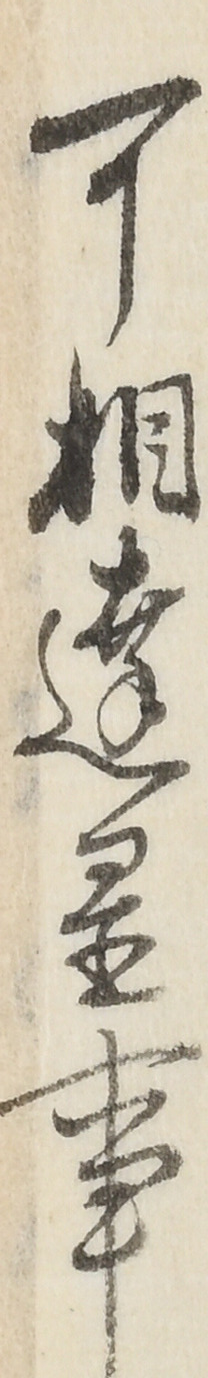可相達置事

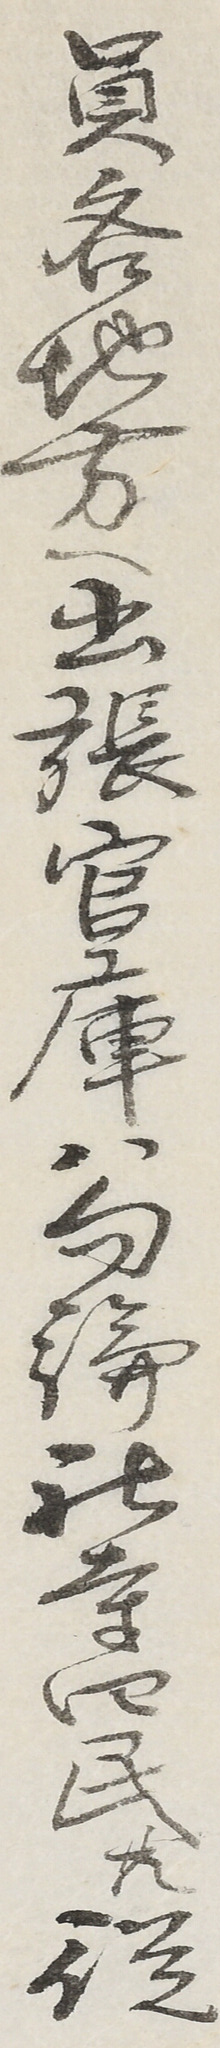員各地方へ出張官庫ハ勿論社寺四民共従
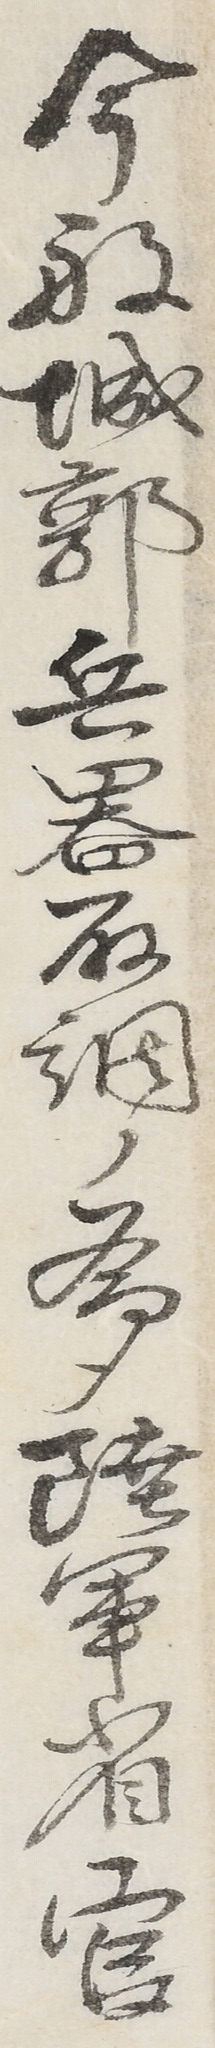今般城郭兵器取調ノ為陸軍省官
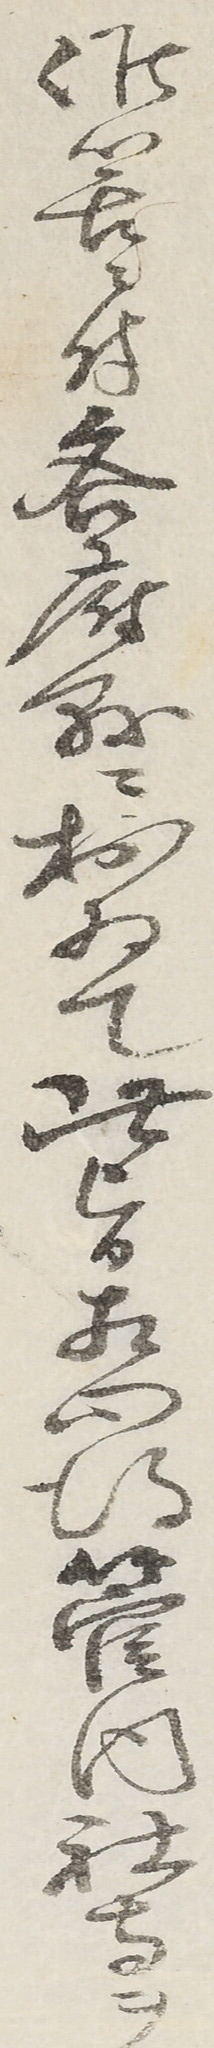候筈ニ付各府県ニおゐて此旨相心得管内社寺ヲ
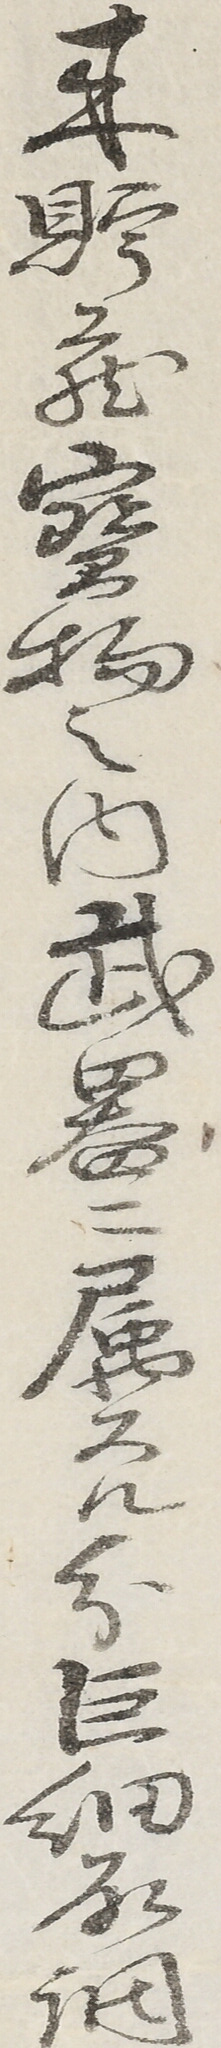来貯蔵宝物之内武器ニ属スル分巨細取調
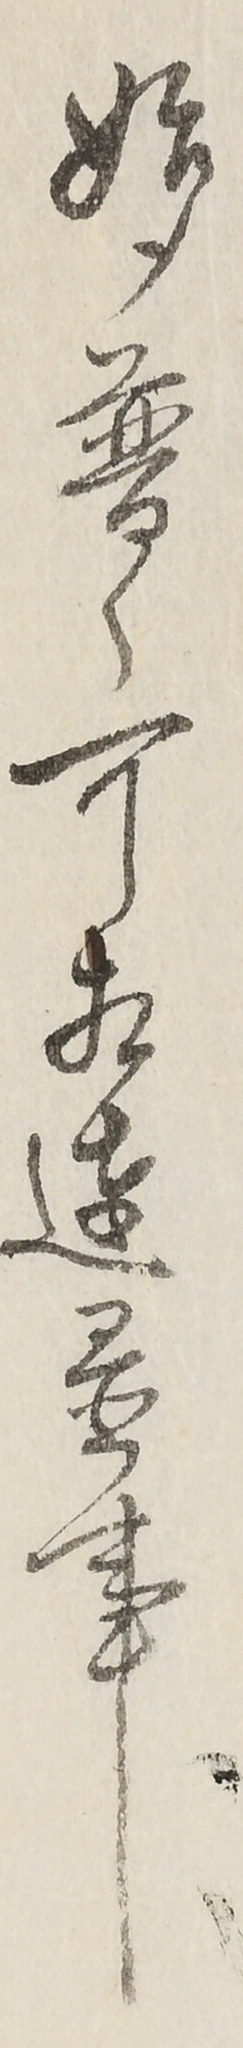始メ普く可相達置事
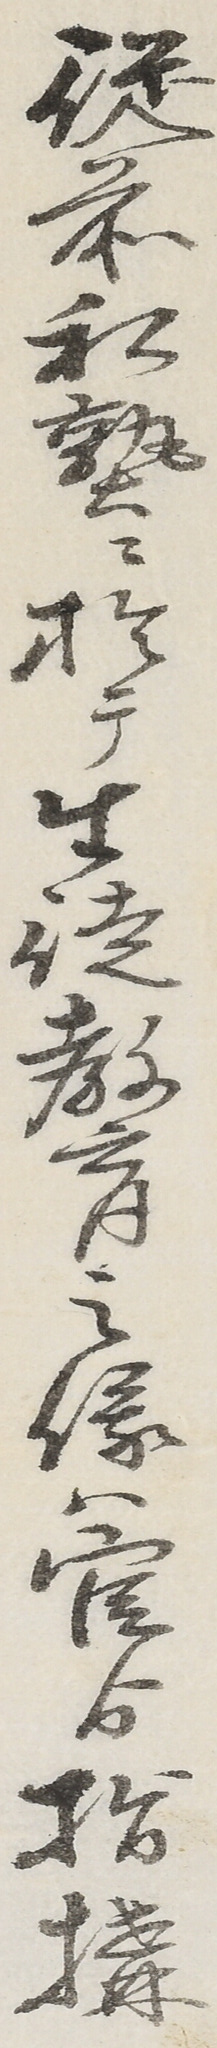従前私塾ニ於テ生徒教育之儀ハ官ゟ指構
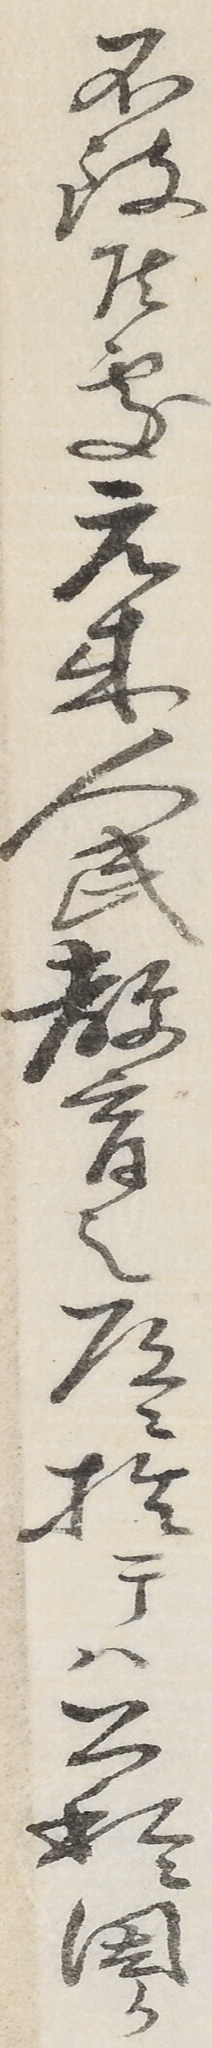不致候処元来人民教育之道ニ於テハ公私ニ因リ
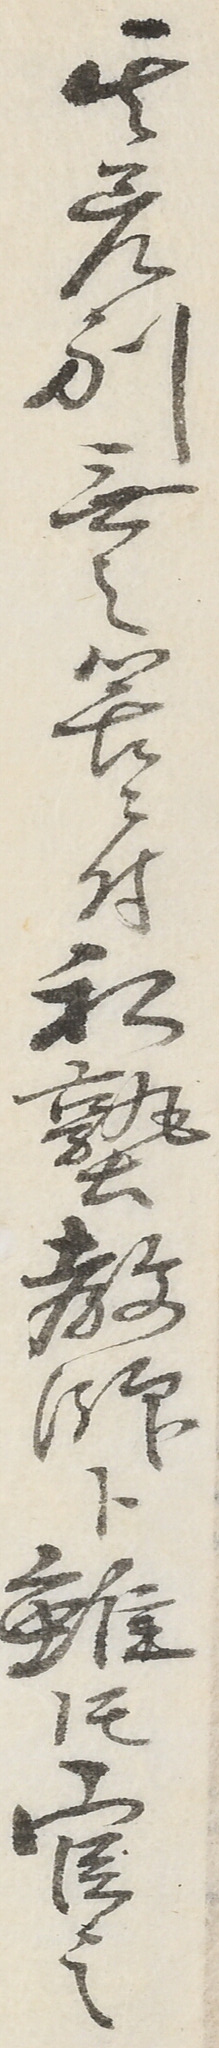其差別無之筈ニ付私塾教師ト雖トモ官之
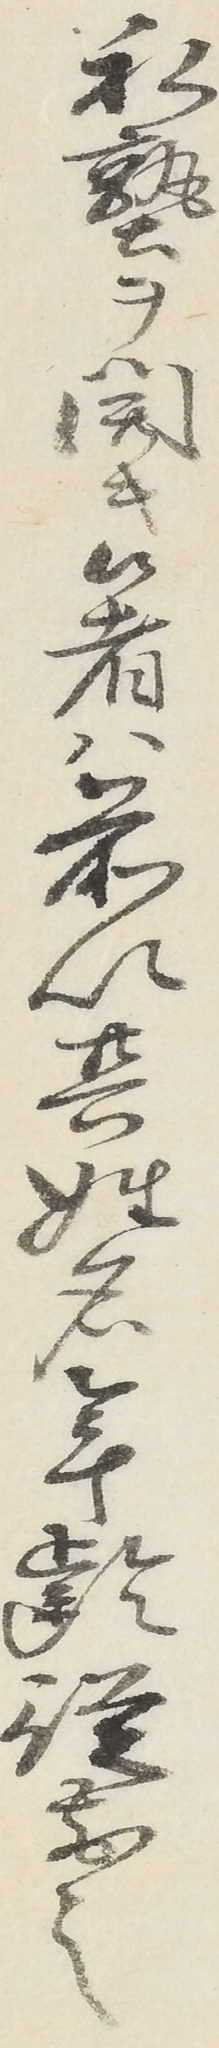私塾ヲ開キ候者ハ前以其姓名年齢従前之
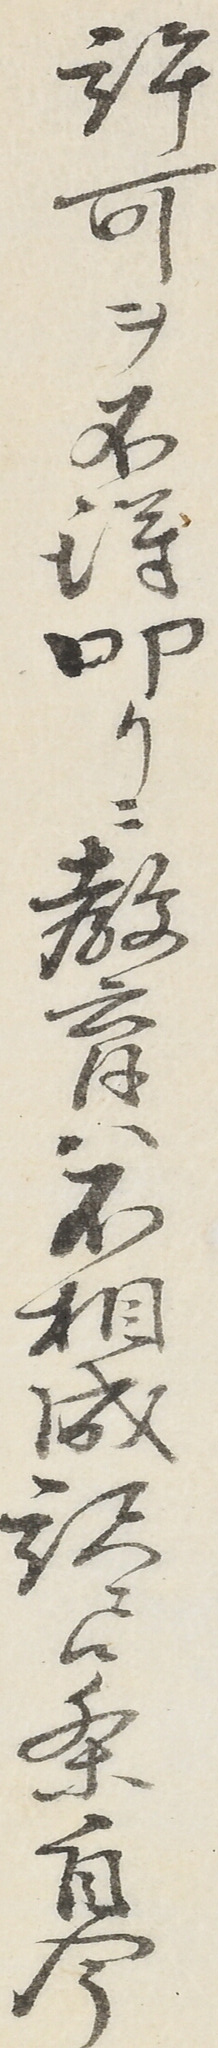許可ヲ不得切リニ教育ハ不相成訳ニ候条自今
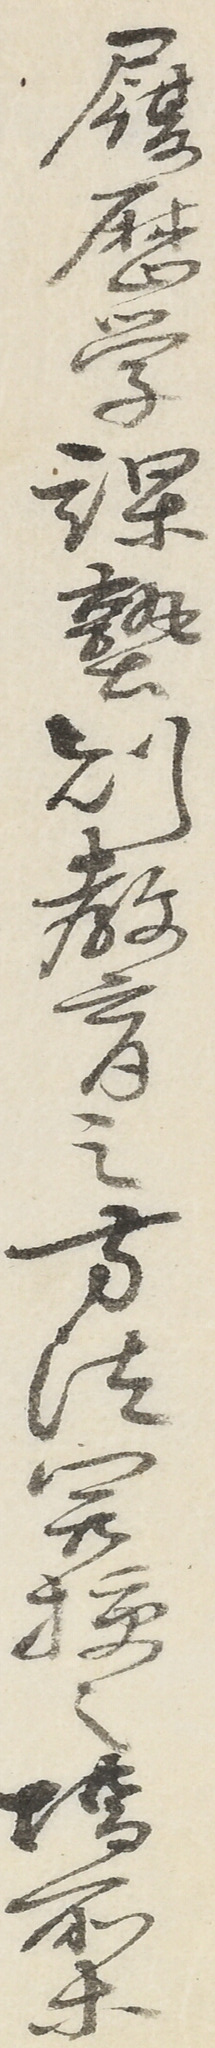履歴学課塾則教育之方法開校之所等
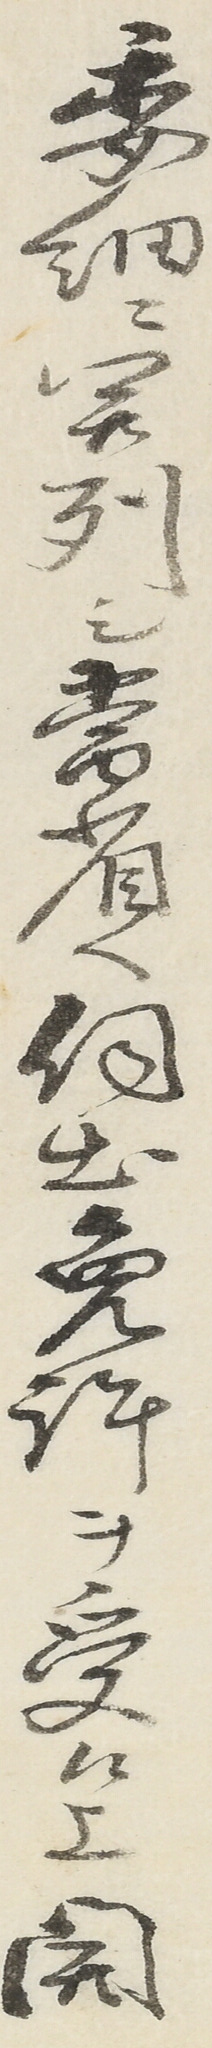委細ニ開列シ当省へ伺出免許ヲ受候上開
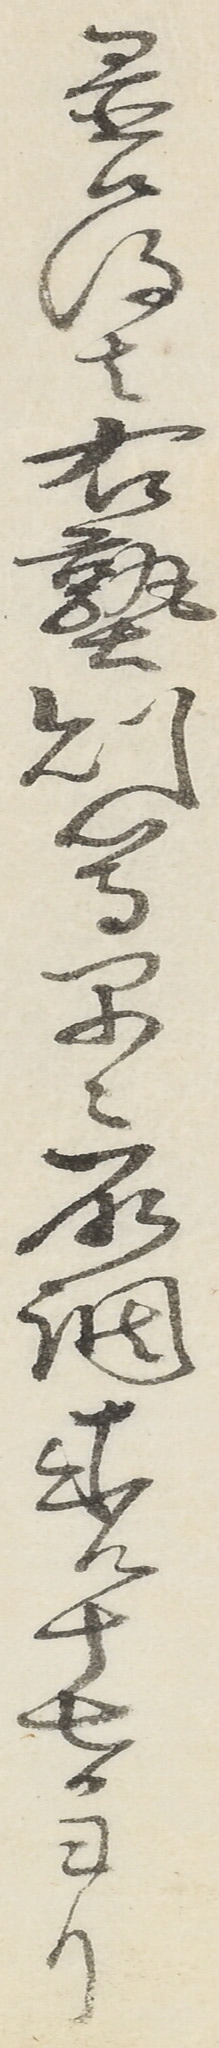置候得は右塾則等早々取調来ル十七日ヨリ
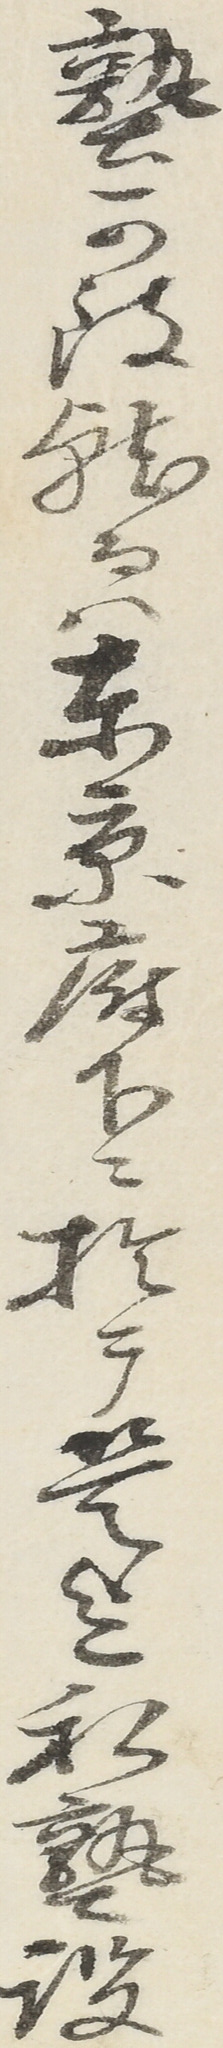塾可致就而ハ東則京府下ニ於テ是迄私塾設
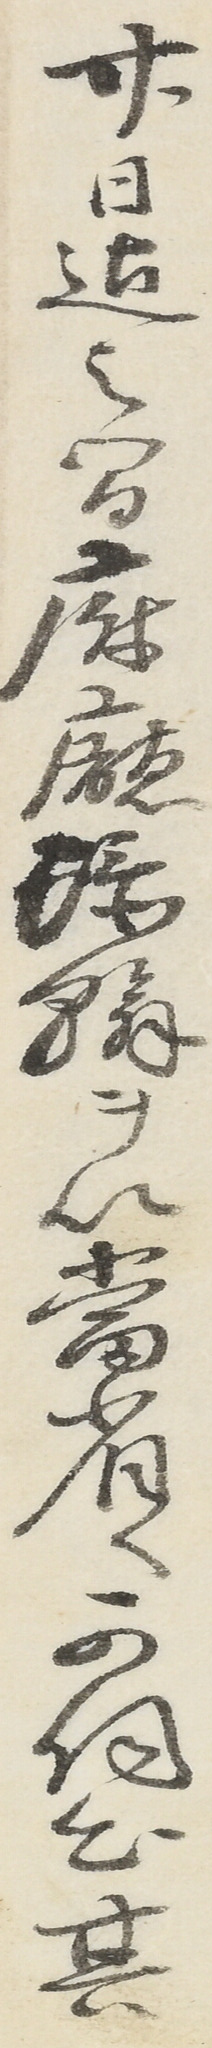廿日迄之間府庁添翰ヲ以当省へ可伺出其
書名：廻状（控）
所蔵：伊那市立高遠町図書館・合同会社AMANE
